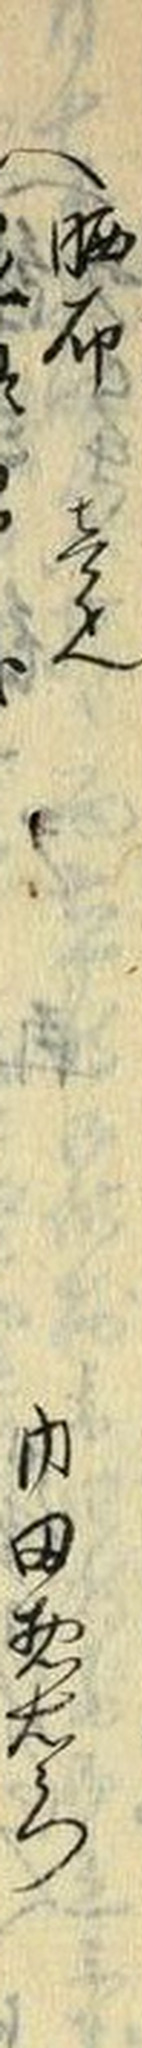晒布壱疋内田平右衛門
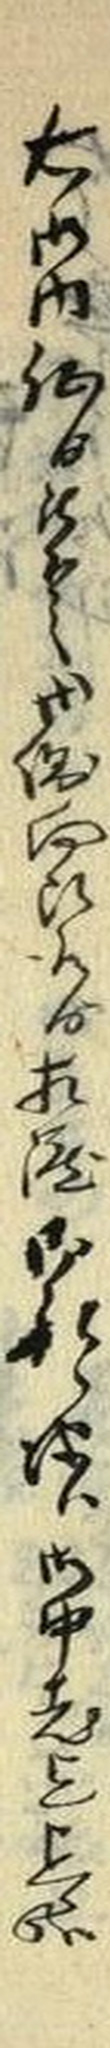右御内証ゟ被下之御側向頭取ゟ相渡御礼之儀ハ御中老迄申上候様
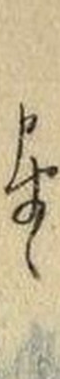申聞候
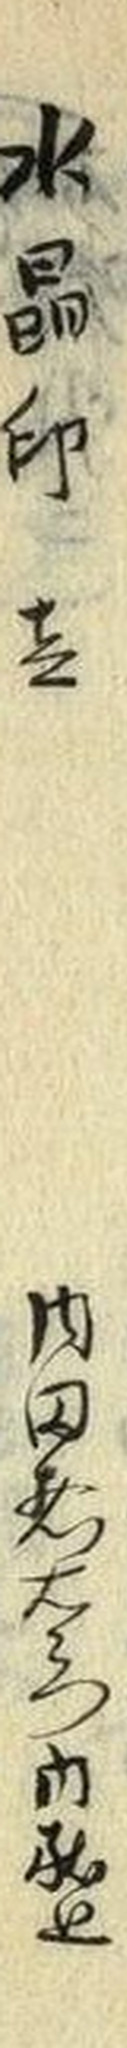水晶印壱内田惣右衛門内献上
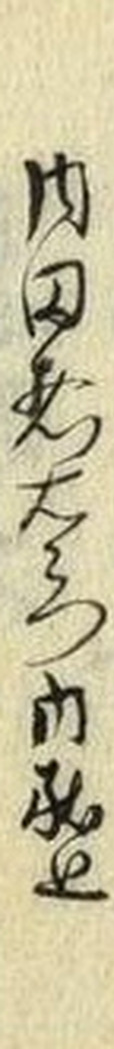水晶印壱内田惣右衛門内献上
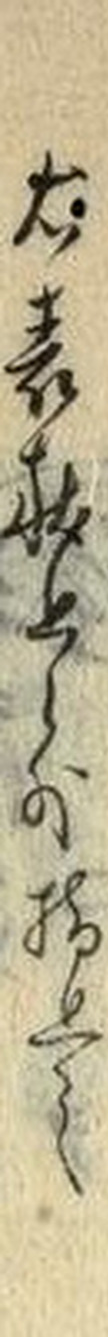右表献上之外指上之
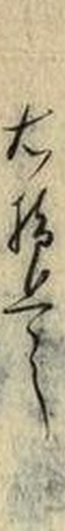右指上之
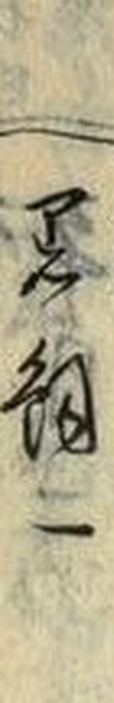黒鯛一

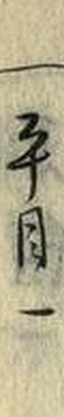平目一
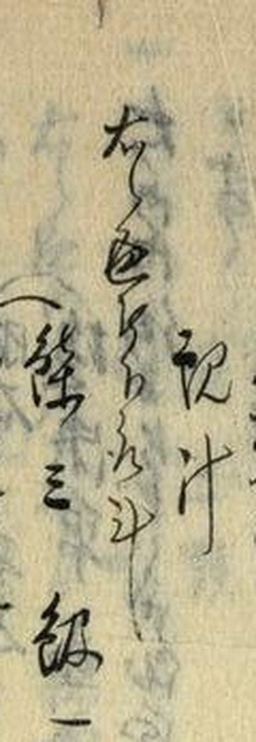右之通被下取計
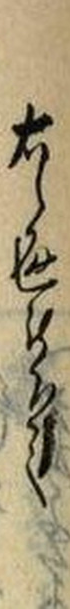右之通被下取計
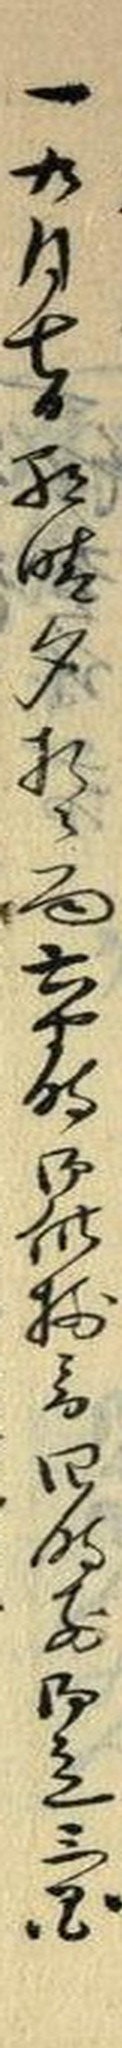一九月七日朝晴夕折々雨六半時御供揃ニ而四時前御立三国
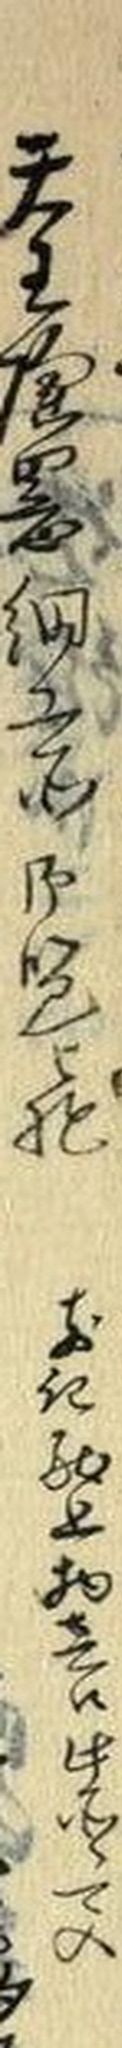天王陶器細工所御覧被遊前記献上物壱口此所へ可入
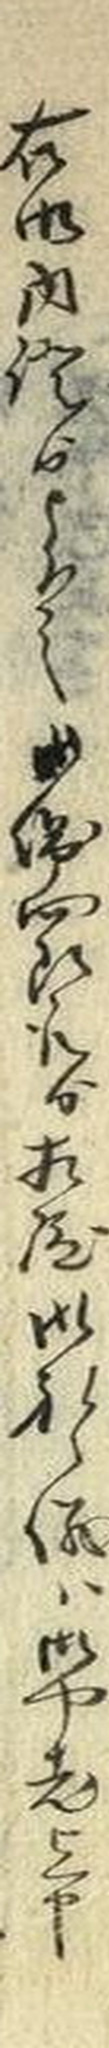右御内証ゟ被下之御側向頭取ゟ相渡御礼之儀ハ御中老迄申
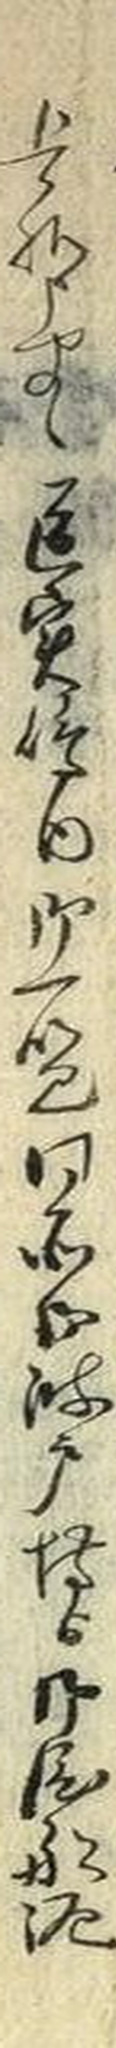上候様申聞候道実嶋内御一覧同所御波戸場ゟ御渡船泥

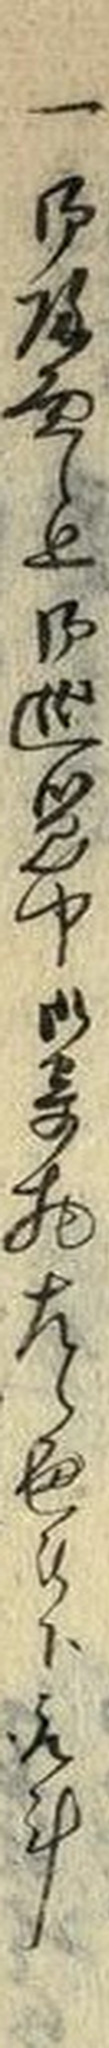一御帰殿之上御巡覧中御寄物左之通被下取計
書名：少傅日録抄（斉承付側向頭取日記、在国）
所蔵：福井県文書館 Fukui Prefectural Archives
